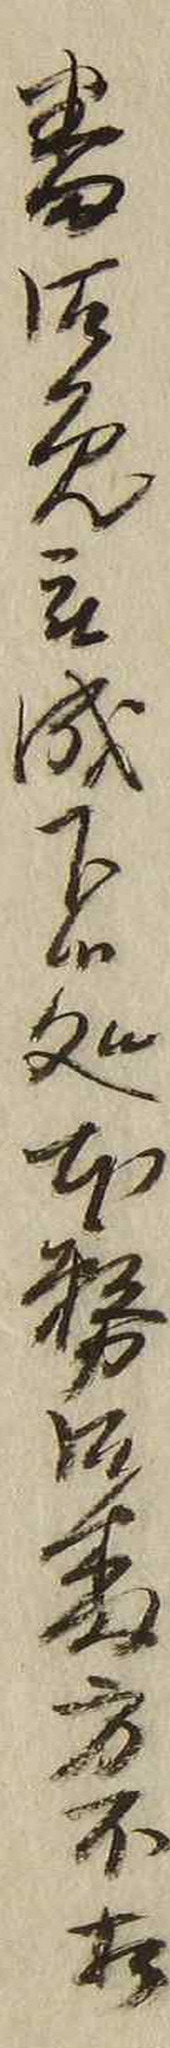番御免被成下候処本務御番方不相

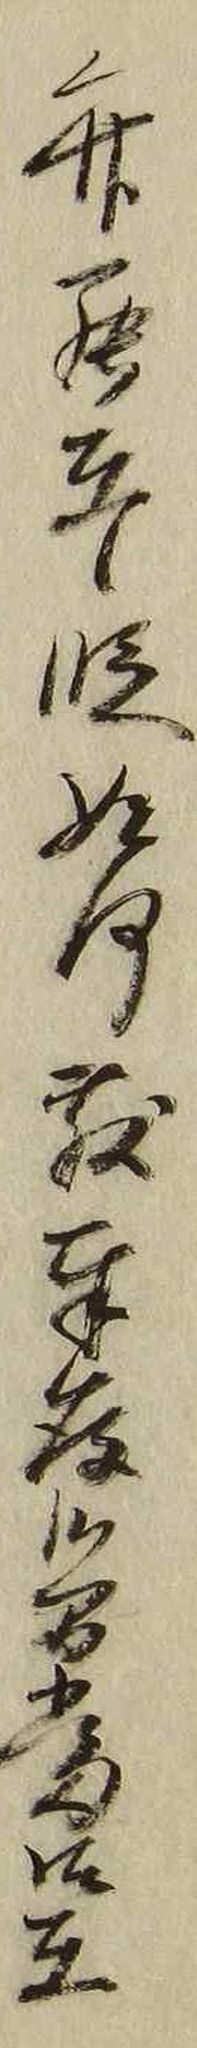弁罷在候段如何敷奉存候間当御在
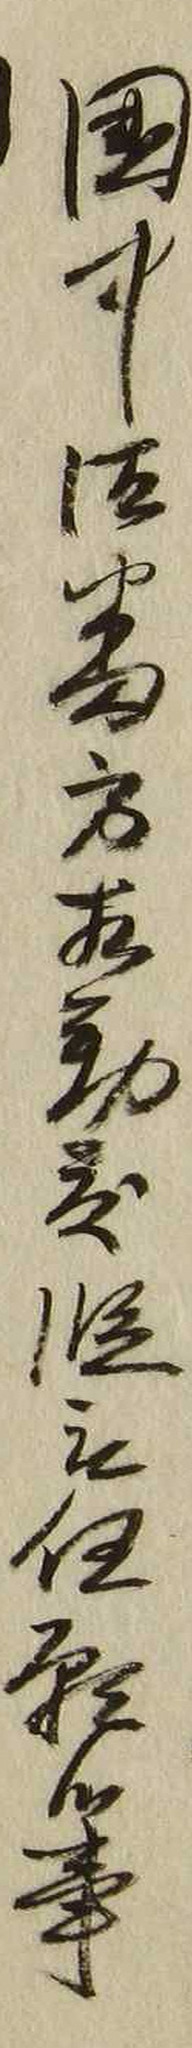国中御番方相勤度段被任願候事
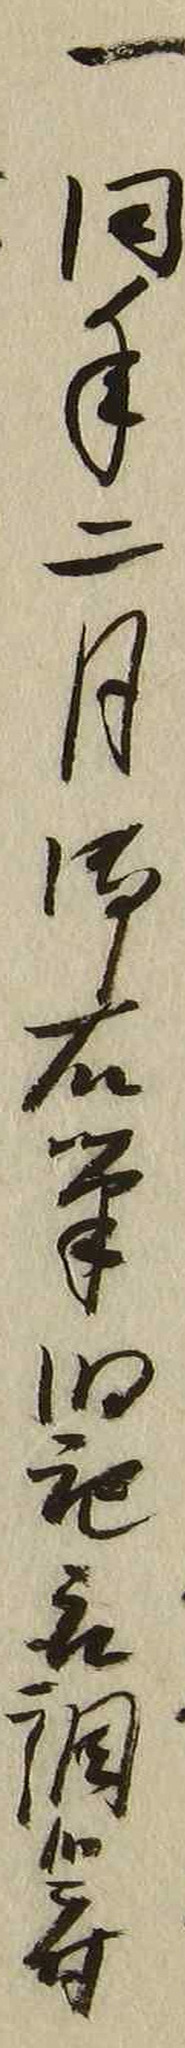一同年二月御右筆旧記取調候ニ付
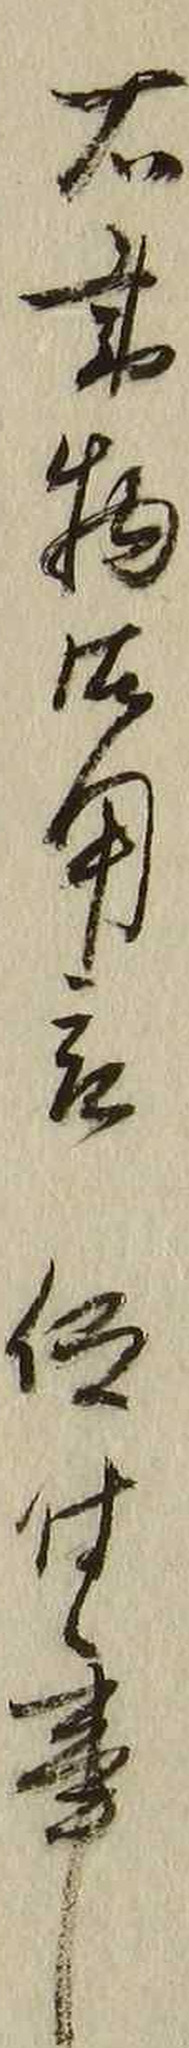右書物御用被仰付候事
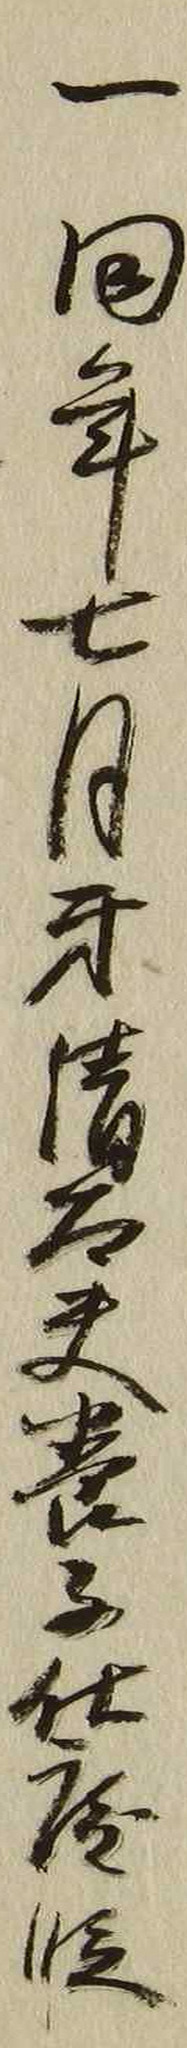一同年七月弟清太夫養子仕度段
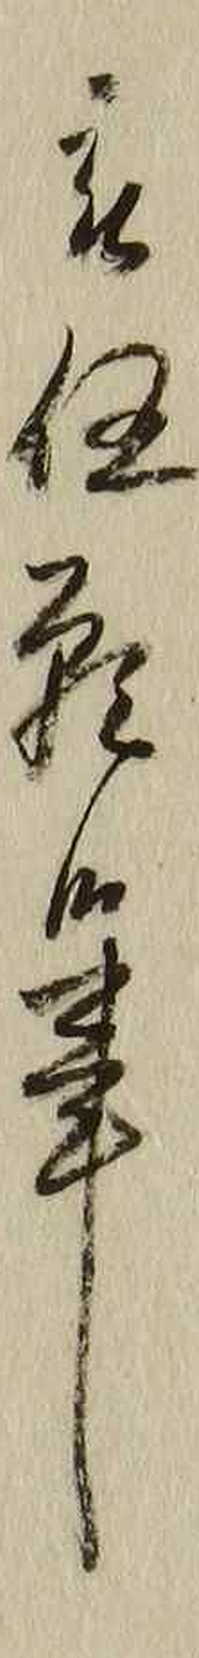被任願候事
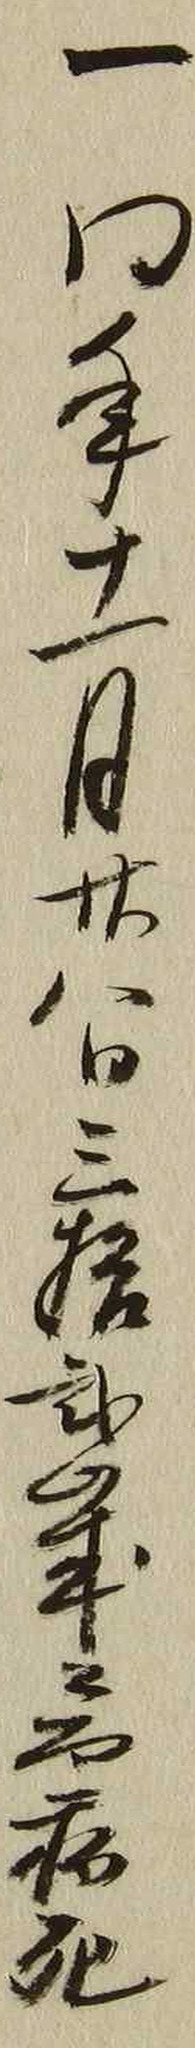一同年十一月廿八日三拾弐歳ニ而病死
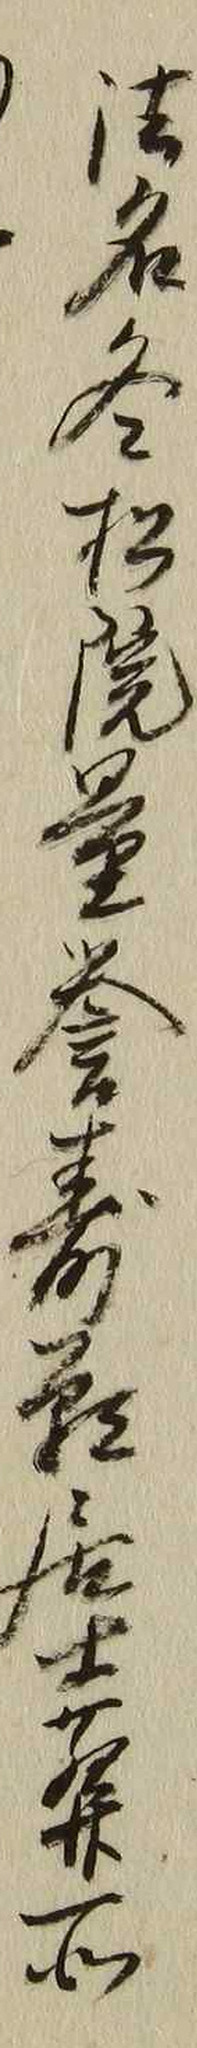法名冬松院量誉寿願居士葬所
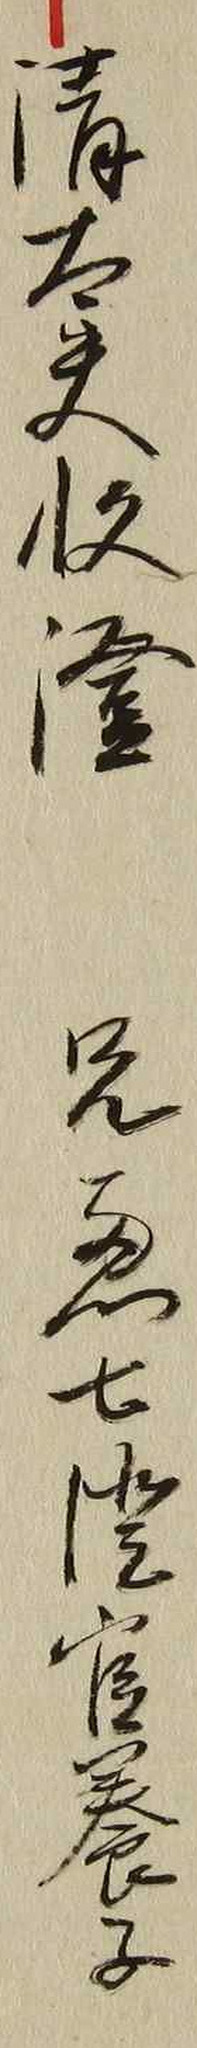清太夫収澄兄恵七澄官養子
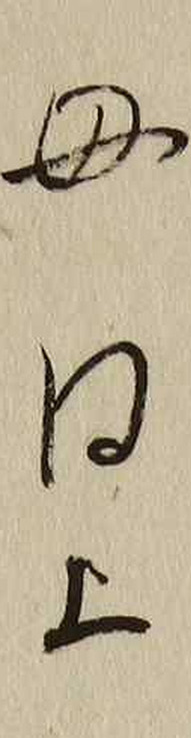母同上
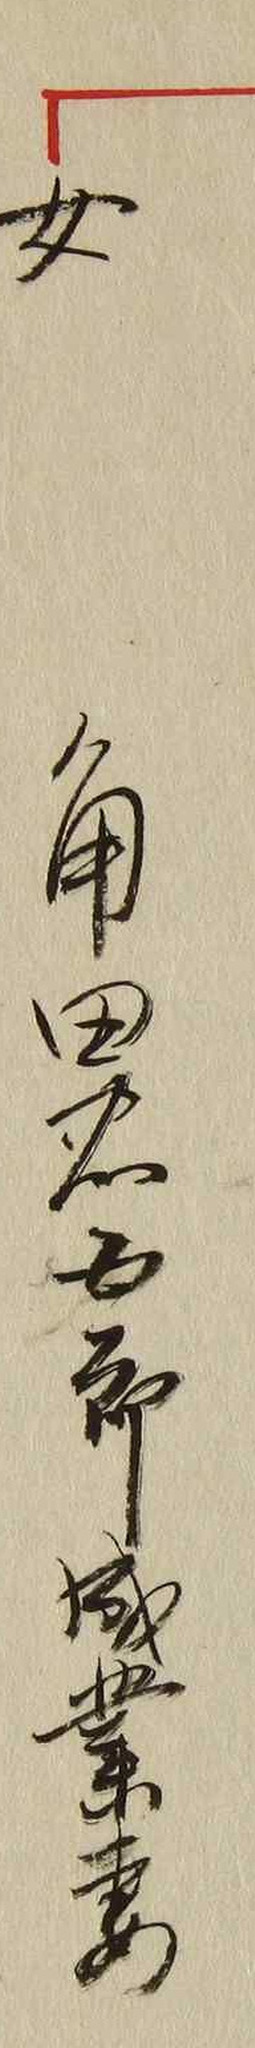女角田忠五郎成業妻
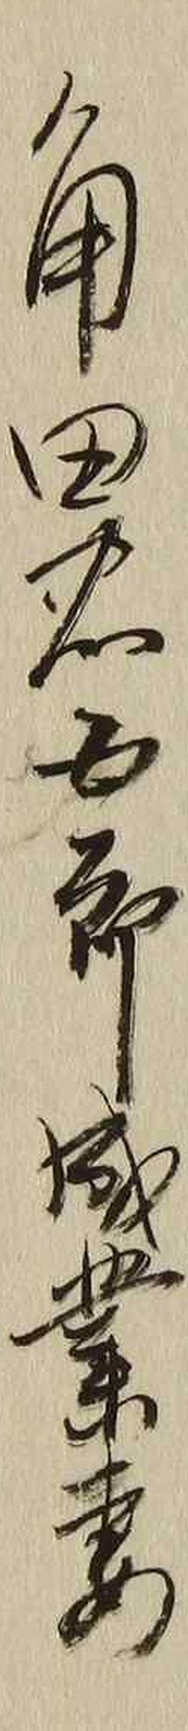女角田忠五郎成業妻

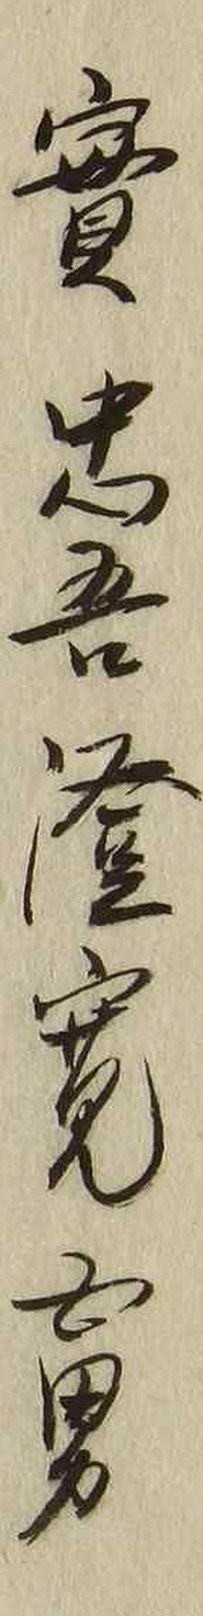実忠吾澄寛五男
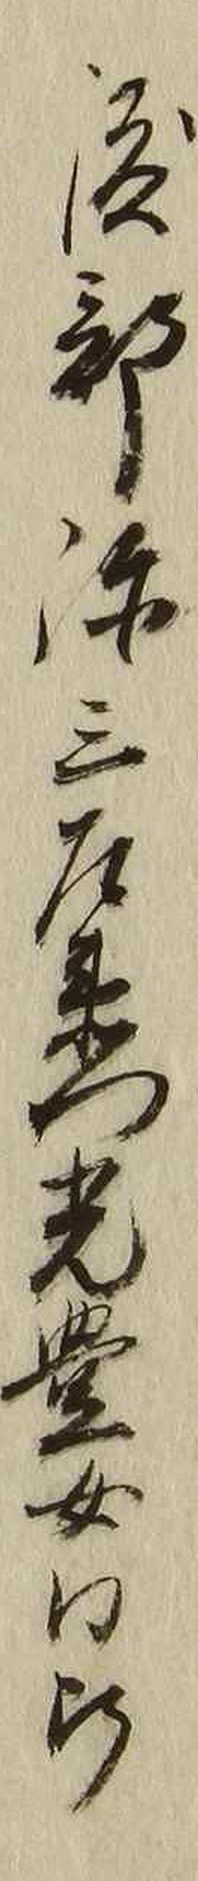渡部弥三左衛門光豊女同断
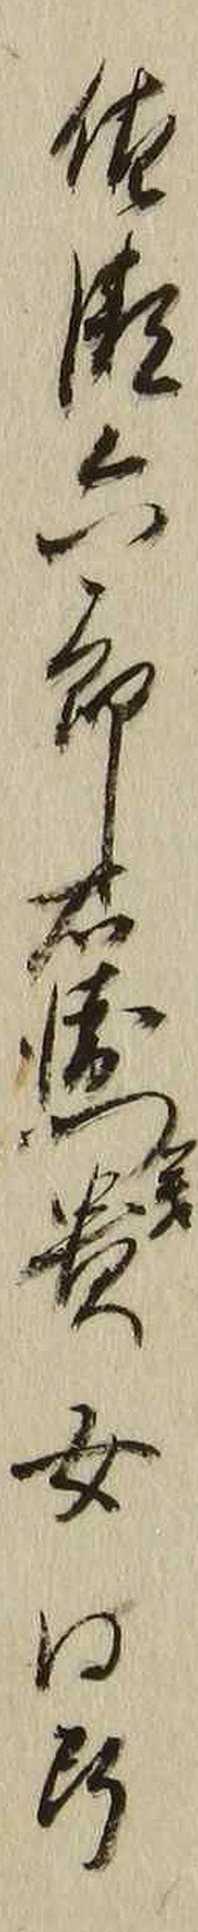佐瀬六郎右衛門義貴女同断
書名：諸士系譜　巻之349　も之部5
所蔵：会津若松市立会津図書館
